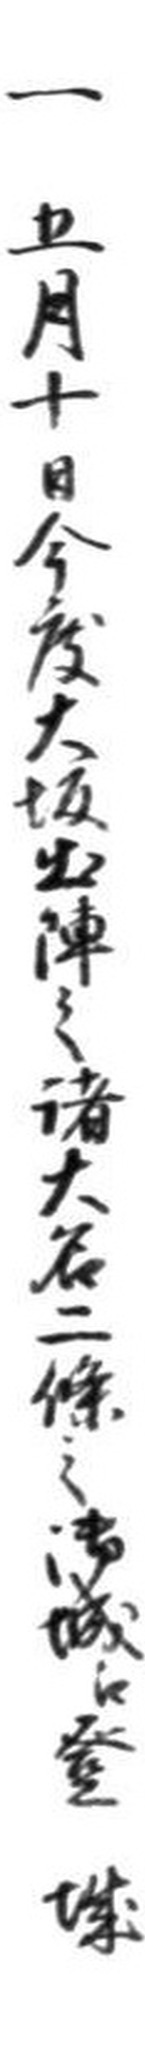一五月十日今度大坂出陣之諸大名二条之御城江登城
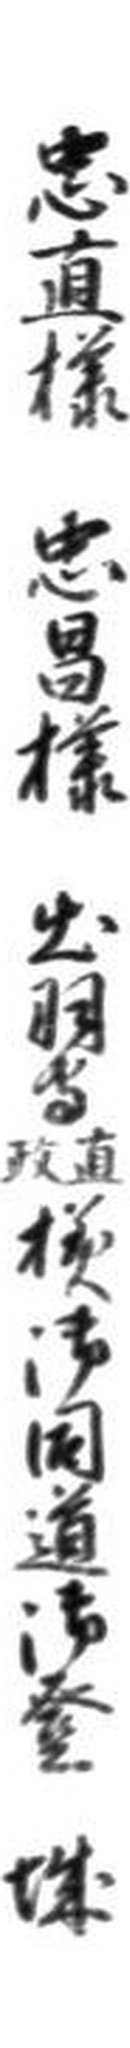忠直様忠昌様出羽守直政様御同道御登城
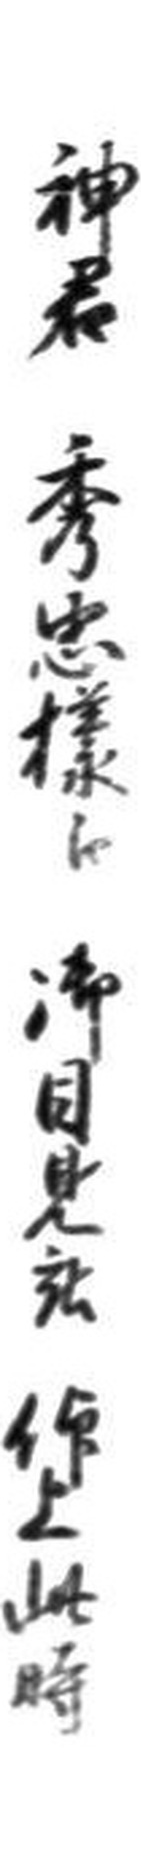神君秀忠様江御目見被仰上此時
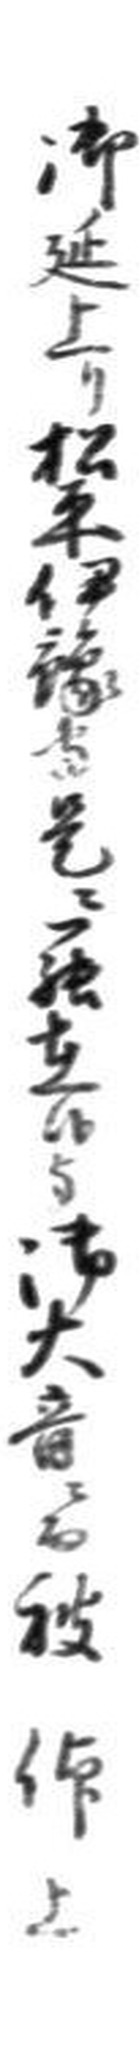御延上り松平伊予守是ニ罷在候と御大音ニ而被仰上
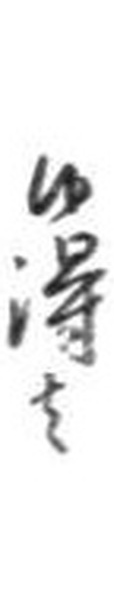候得は
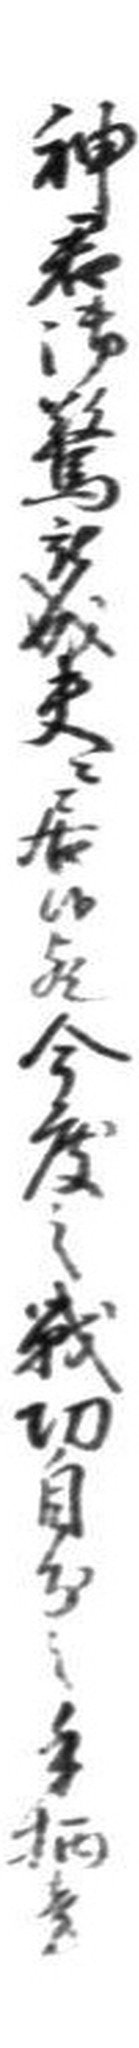神君御驚被成夫ニ居候歟今度之戦功自分之手柄旁
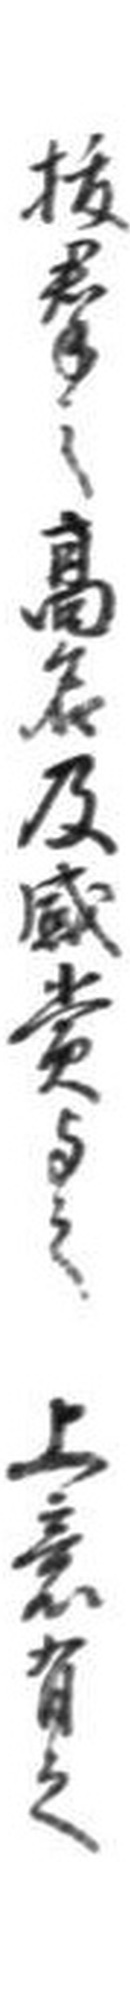抜群之高名及感賞と之上意有之

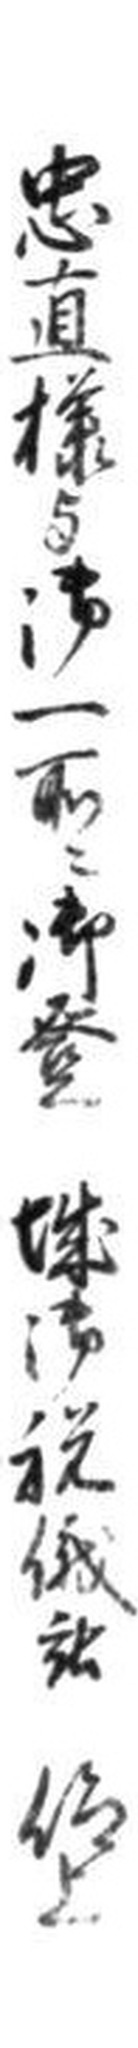忠直様と御一所ニ御登城御祝儀被仰上
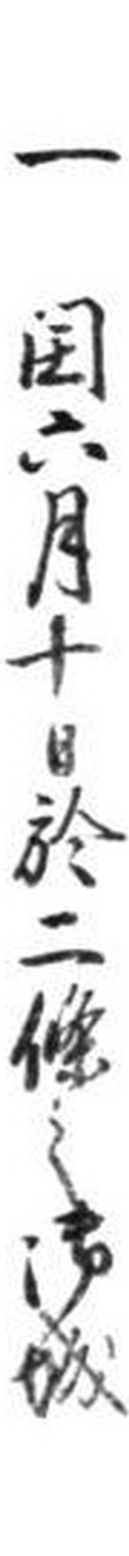一閏六月十日於二条之御城
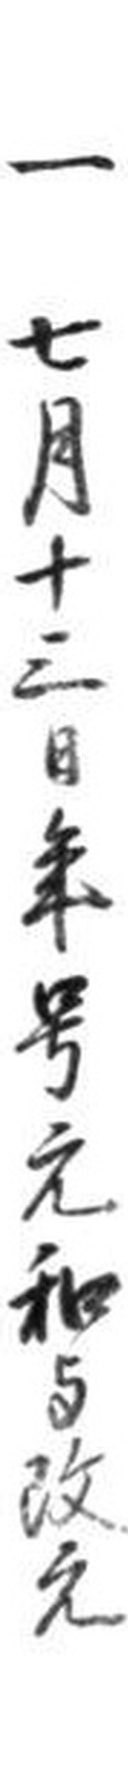一七月十三日年号元和と改元
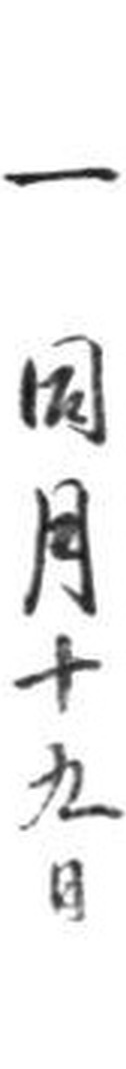一同月十九日
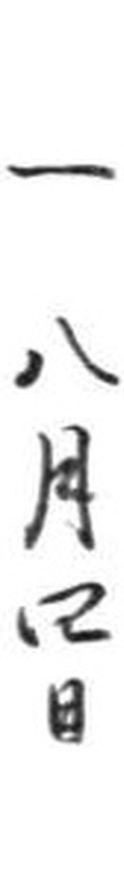一八月四日
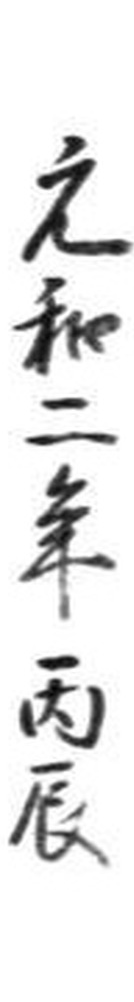元和二年丙辰
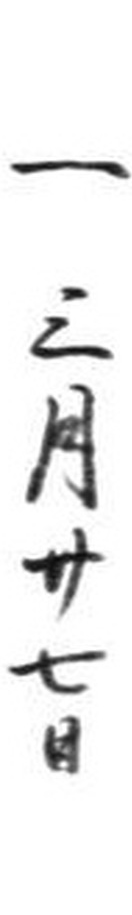一三月廿七日
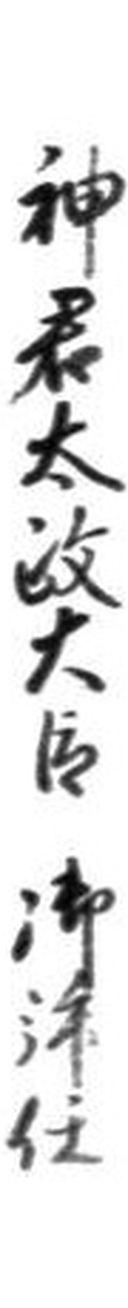神君太政大臣御拝任
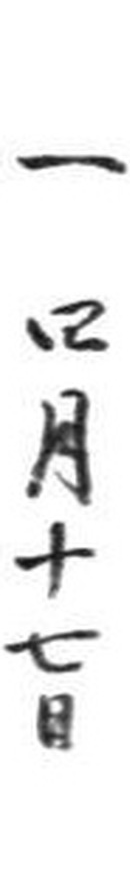一四月十七日
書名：家譜 三 忠昌公 従慶長八年到寛永六年
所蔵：福井県文書館 Fukui Prefectural Archives
